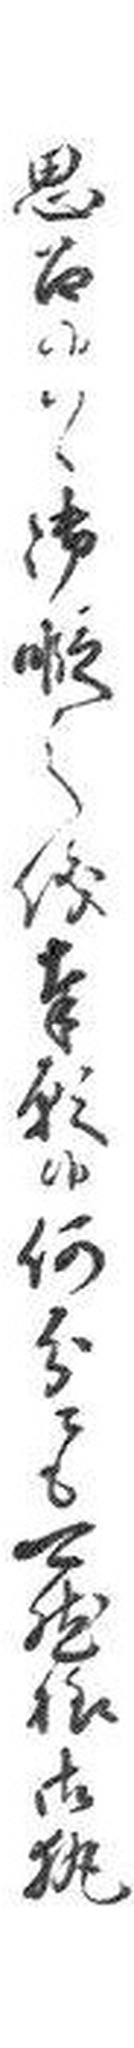思召候ハヽ御暇之儀奉願候何分ニも可然様御執
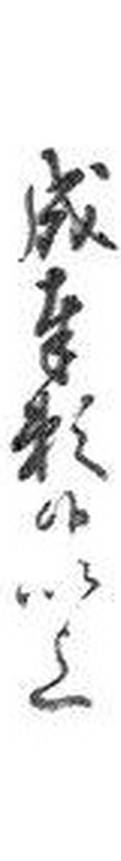成奉頼候以上
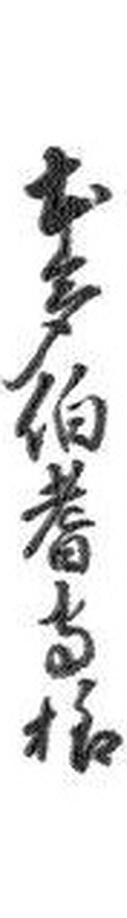本多伯耆守様
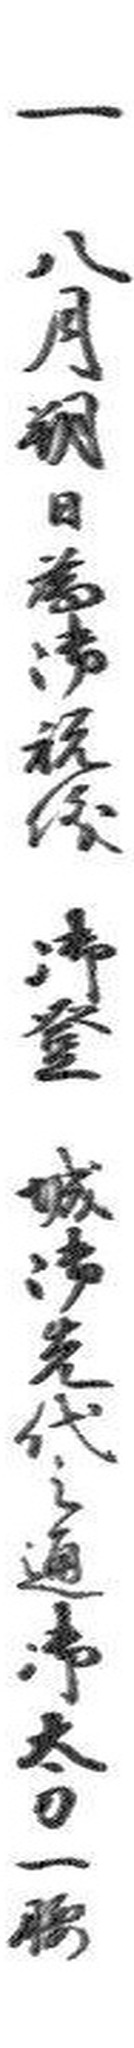一八月朔日為御祝儀御登城御先代之通御太刀一腰
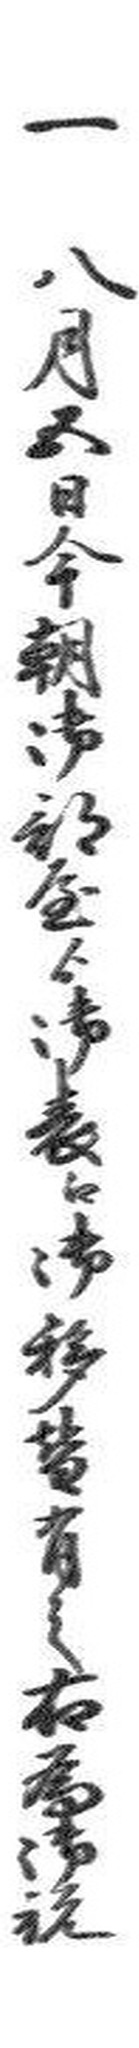一八月五日今朝御部屋ゟ御表江御移替有之右為御祝
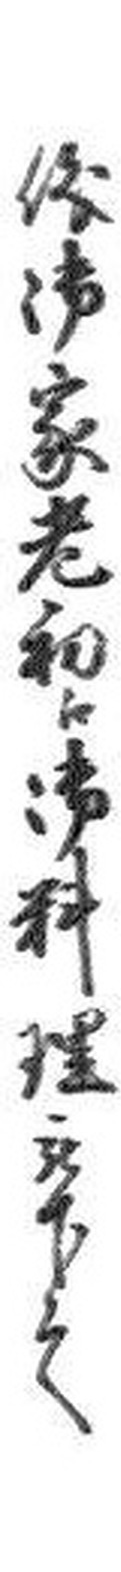儀御家老初江御料理被下之
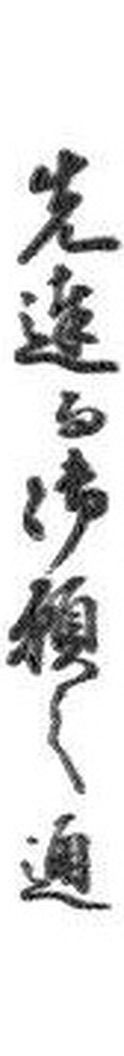先達而御願之通
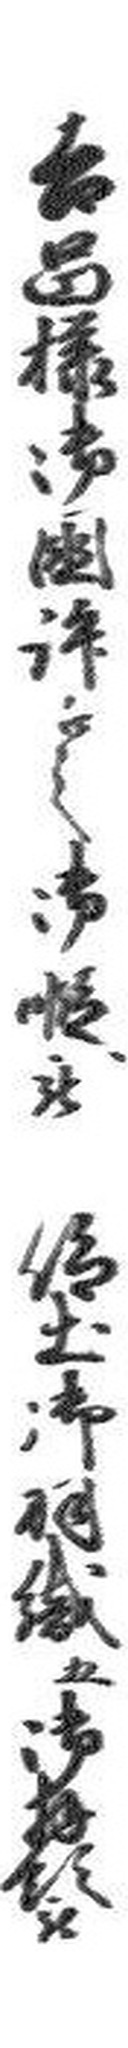吉品様御国許江之御暇被仰出御羽織五御拝領被
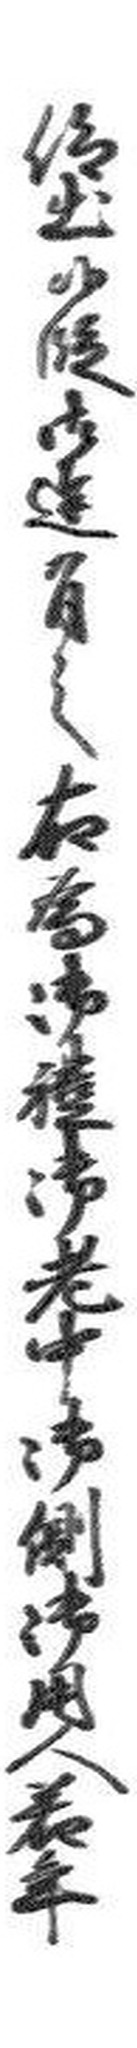仰出候段御達有之右為御礼御老中御側御用人若年
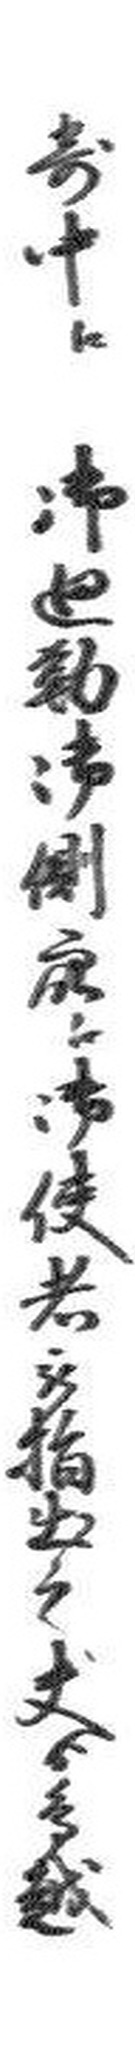寄中江御廻勤御側衆江御使者被指出之夫ゟ鳥越

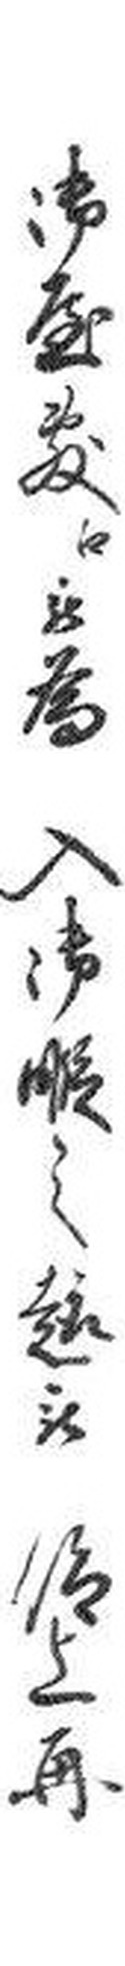御屋敷江被為入御暇之趣被仰上再
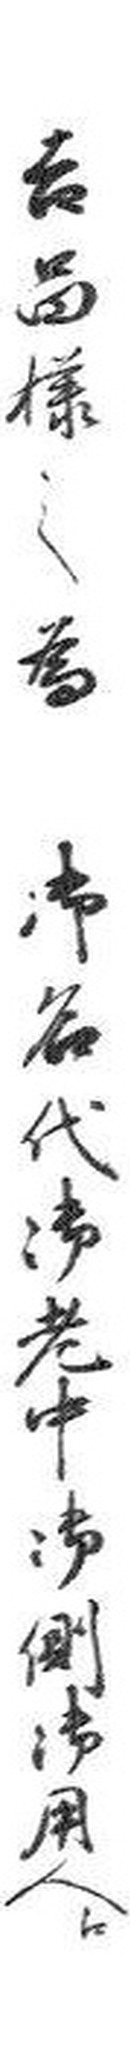吉品様之為御名代御老中御側御用人江
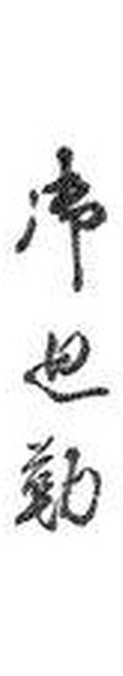御廻勤
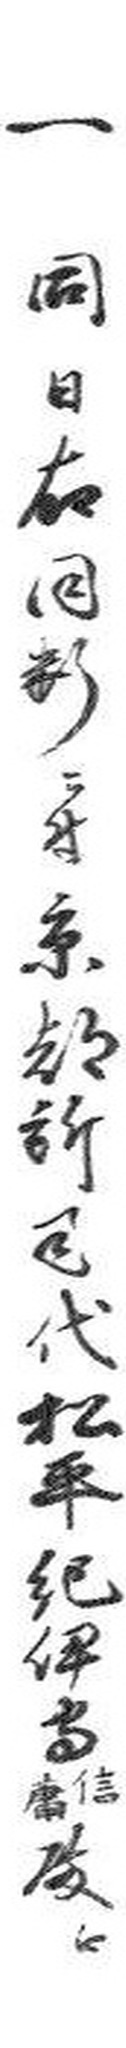一同日右同断ニ付京都所司代松平紀伊守信庸殿江
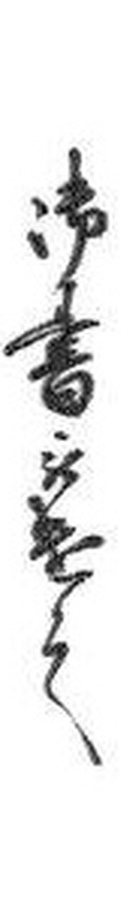御書被遣之
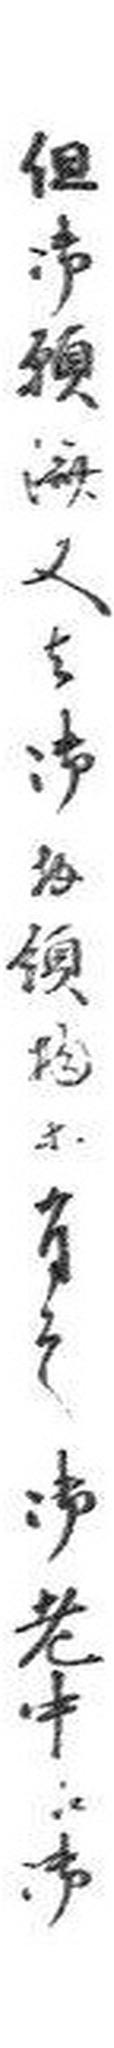但御願済又者御拝領物等有之御老中江御
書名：家譜 二十八 吉邦公 従宝永七年七月五日到正徳元年十二月
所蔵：福井県文書館 Fukui Prefectural Archives
